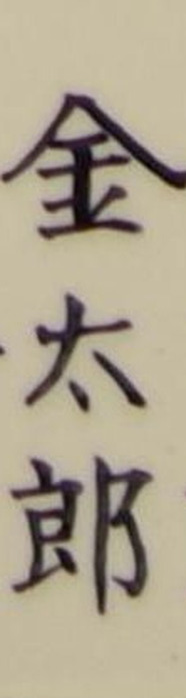金太郎
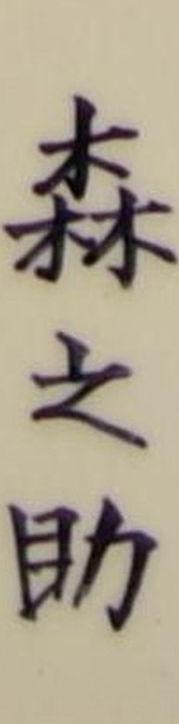森之助
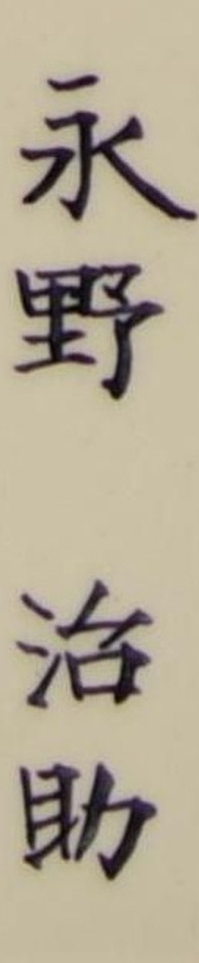永野治助
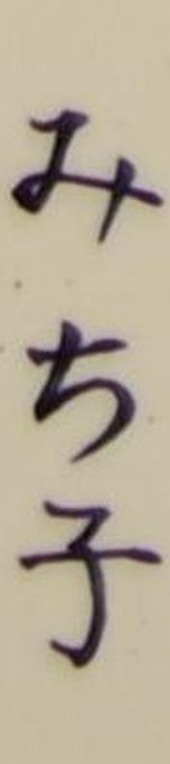みち子
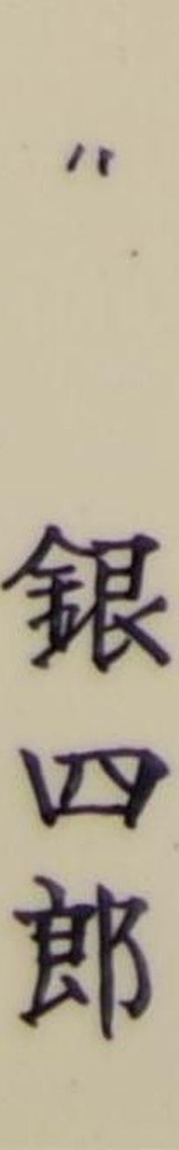銀四郎
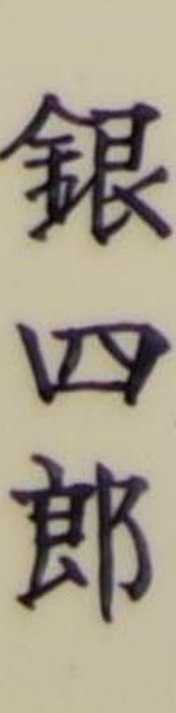銀四郎
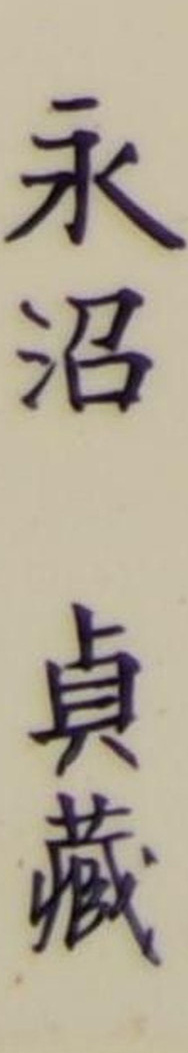永沼貞蔵
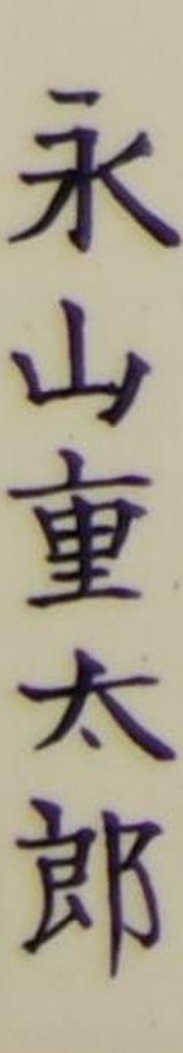永山重太郎

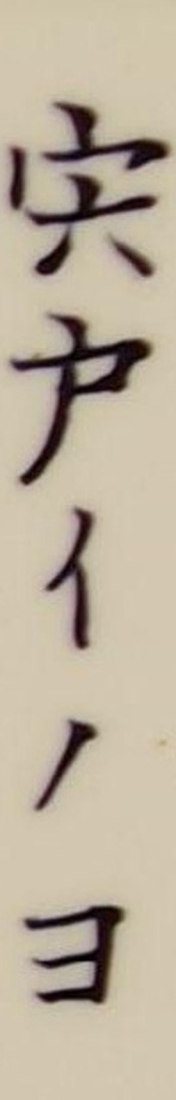宍戸イノヨ
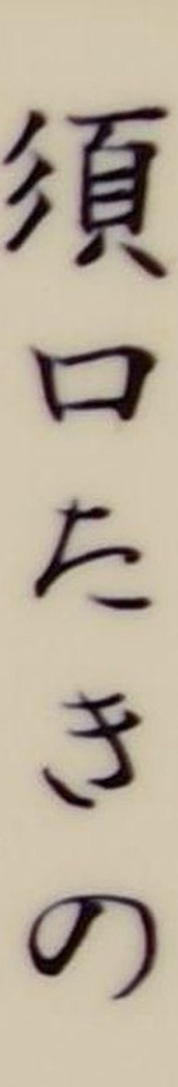須口たきの
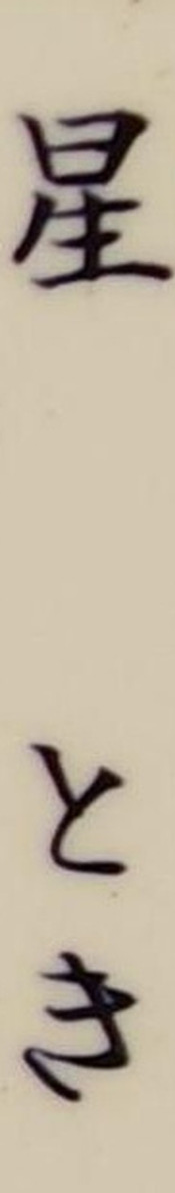星とき
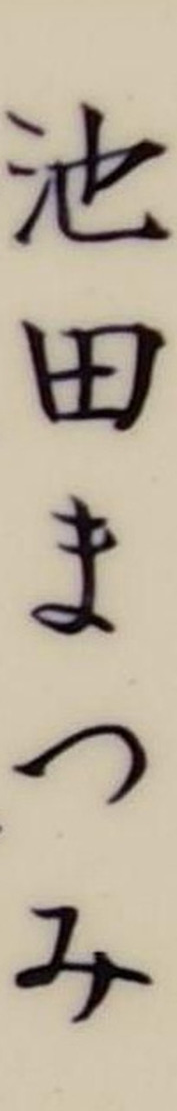池田まつみ
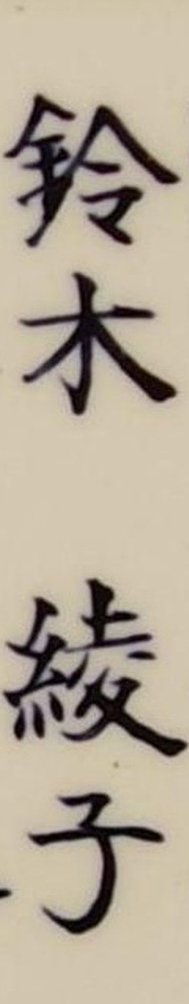鈴木綾子
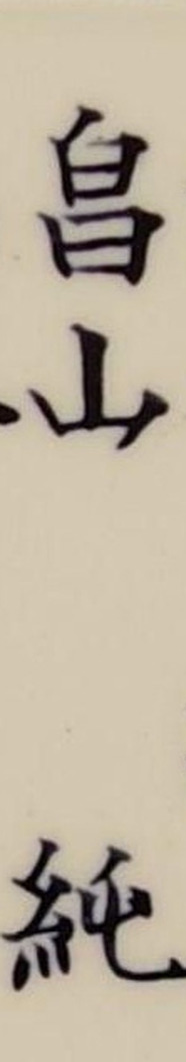畠山純
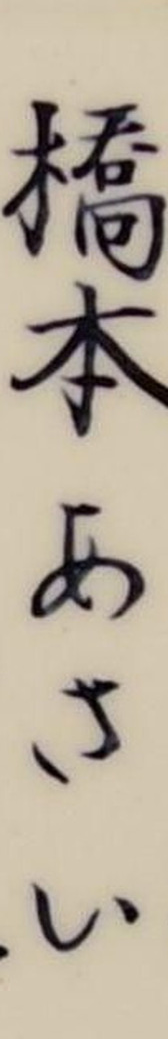橋本あさい
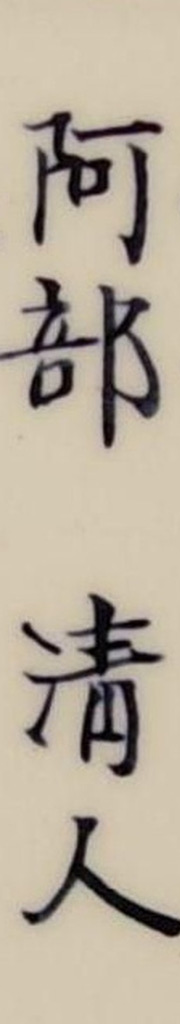阿部清人
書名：A~D
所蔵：koyasan kongobuji
